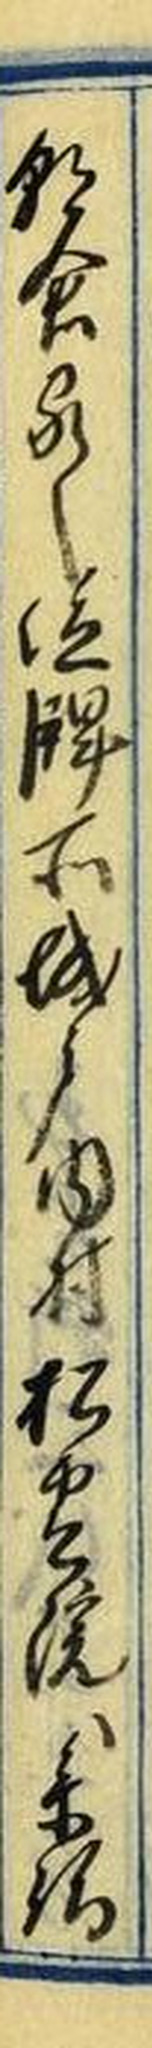朝倉家之位牌所城戸内村松雲院へ参詣
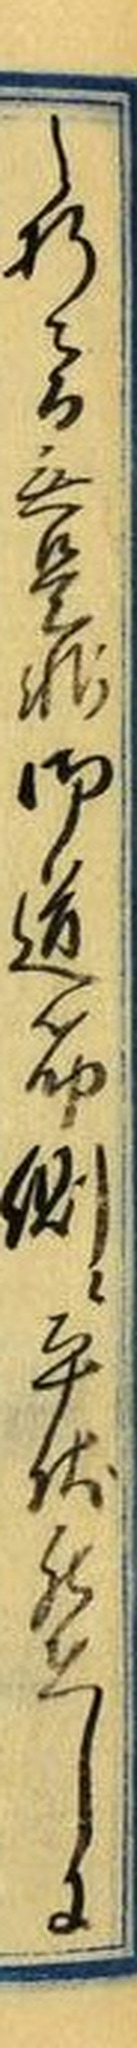之折に而無是非御道筋側に平伏罷在しに
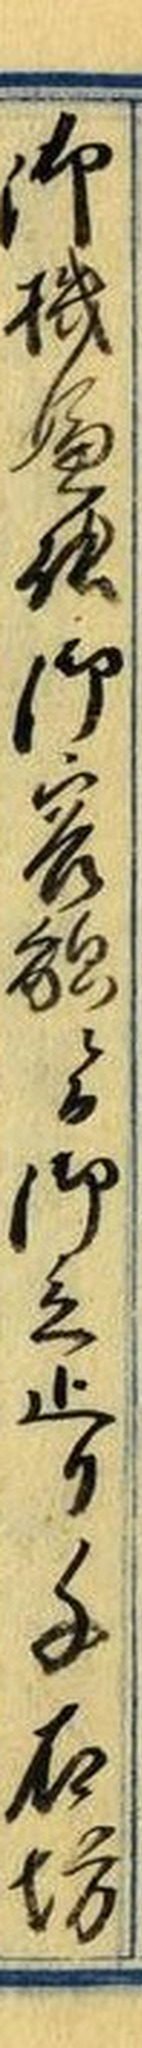御機嫌能御容貌に而御立止り千石坊
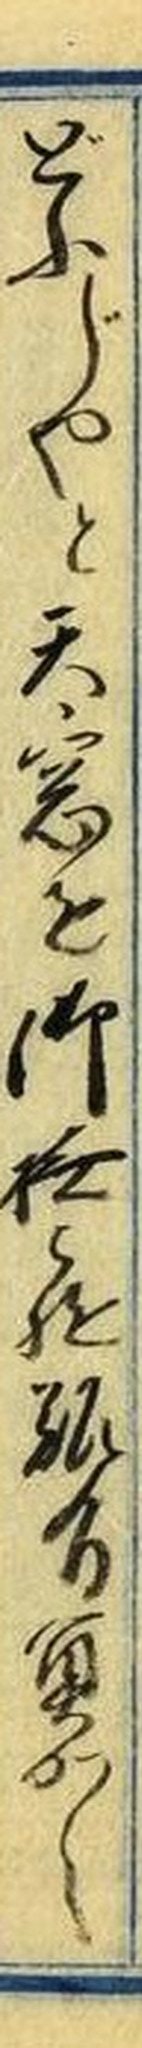どふじやと天窓を御撫被遊難有冥加之
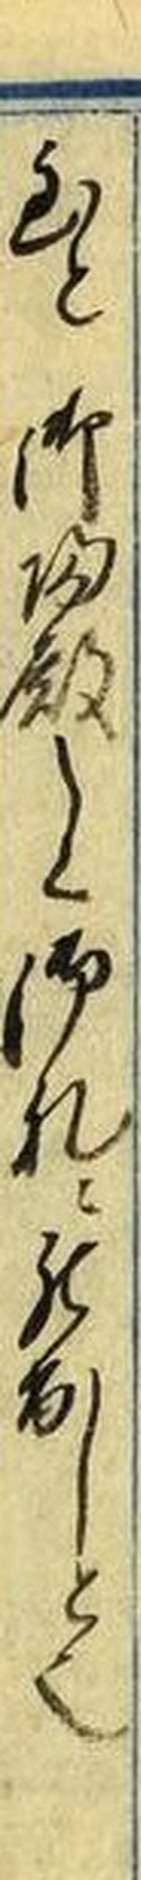至と御帰殿之上御礼に罷出しと也
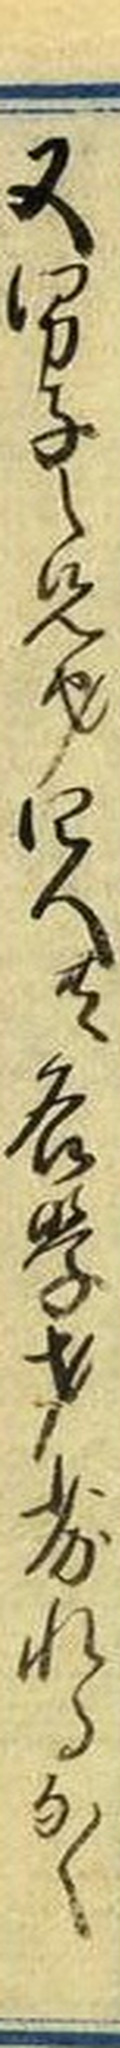又男子之兄弟四人共各学才劣れるなく
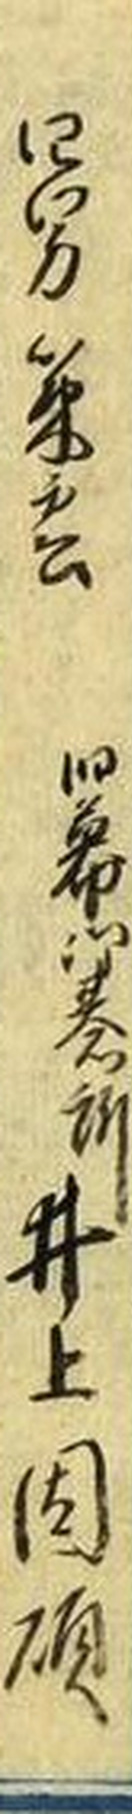四男策雲旧幕御碁所井上因碩
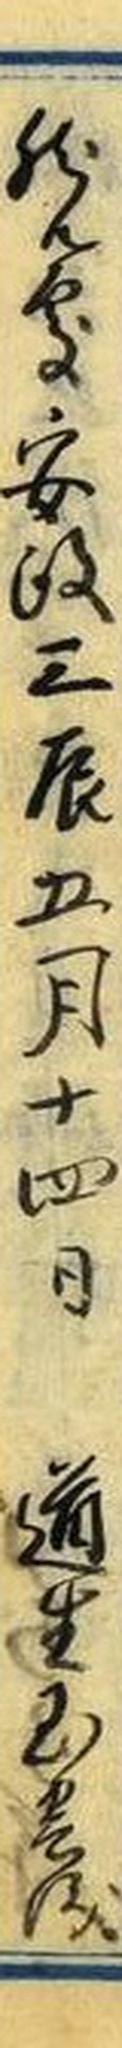然る処安政三辰五月十四日道生玉雲儀

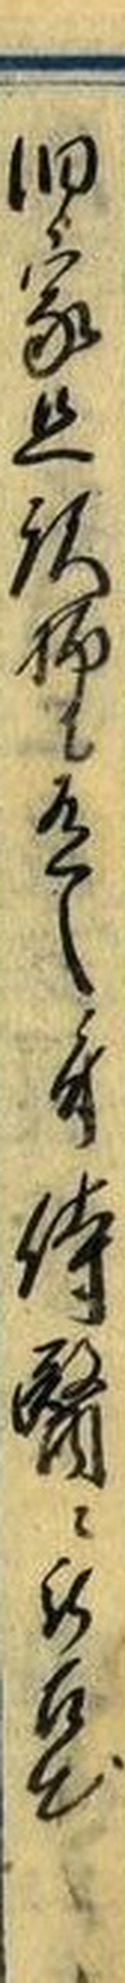旧家且訳抔も有之に付侍医に被召出
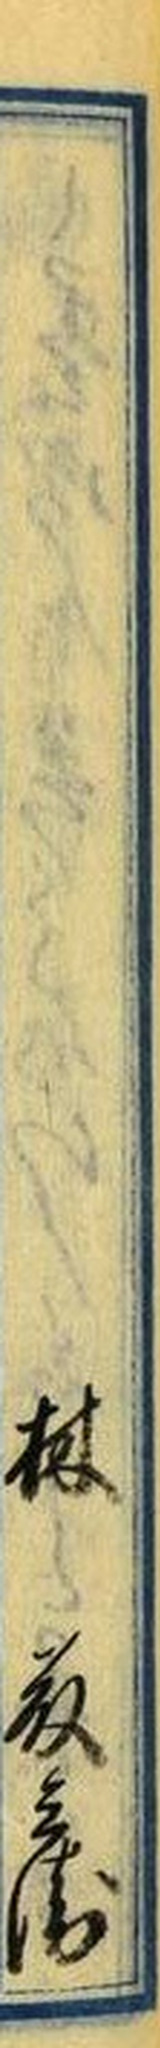林藤兵衛
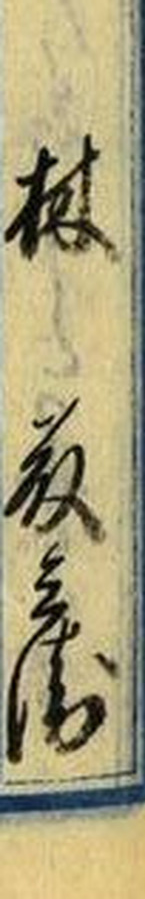林藤兵衛
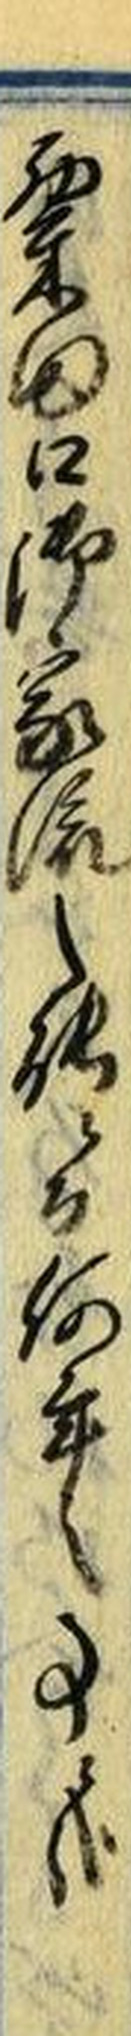粟田口御家流之能に而何年之事に哉
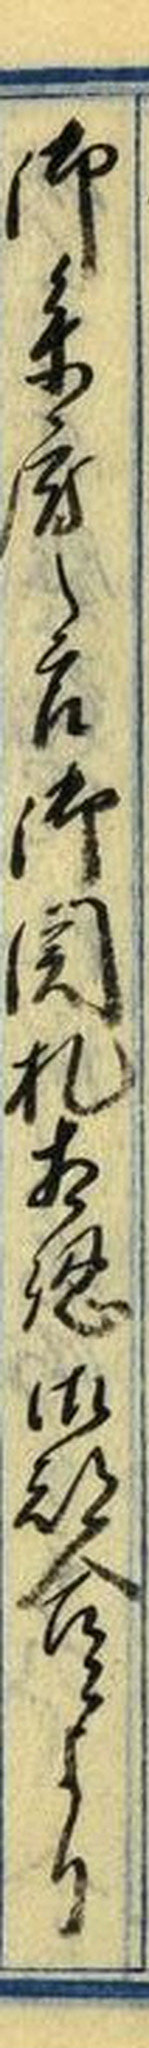御参府之節御関札相認御都合により
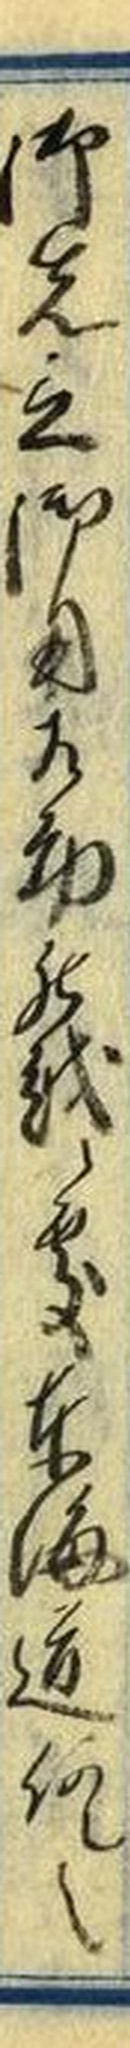御先立御用相勤罷越候処東海道何れ之
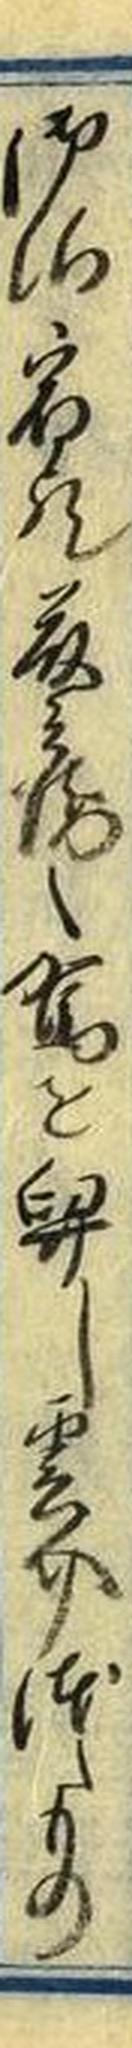御泊宿か藤兵衛之駕を舁し雲介体之もの
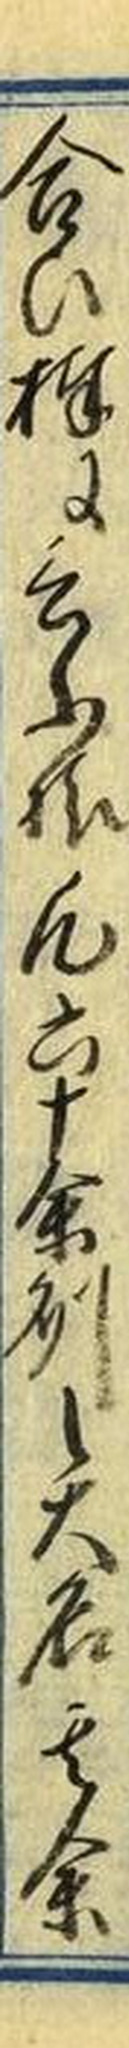合い棒に言ふ様凡六十余州之大名其余
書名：温古集 四巻
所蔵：福井県文書館 Fukui Prefectural Archives
